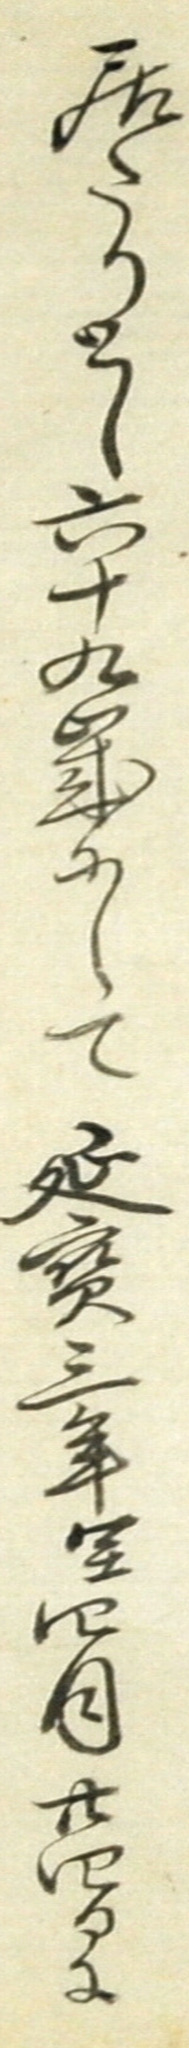居たりとし六十九歳にして延宝三年閏四月廿四日に
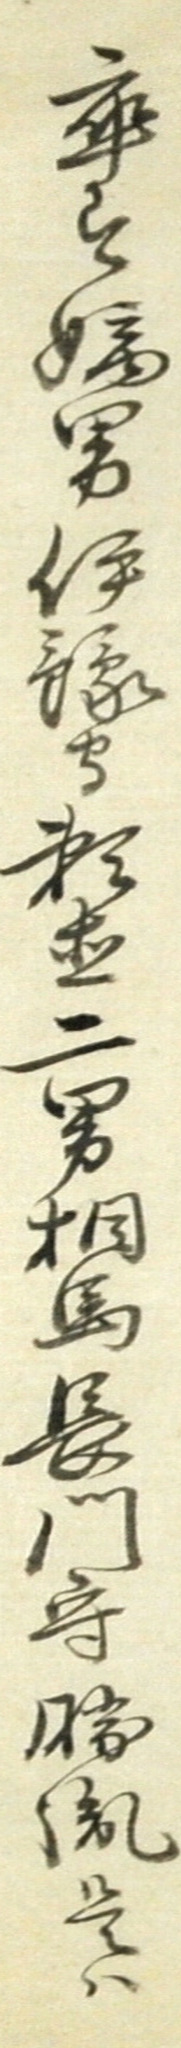卒す嫡男伊予守頼直二男相馬長門守勝胤是は

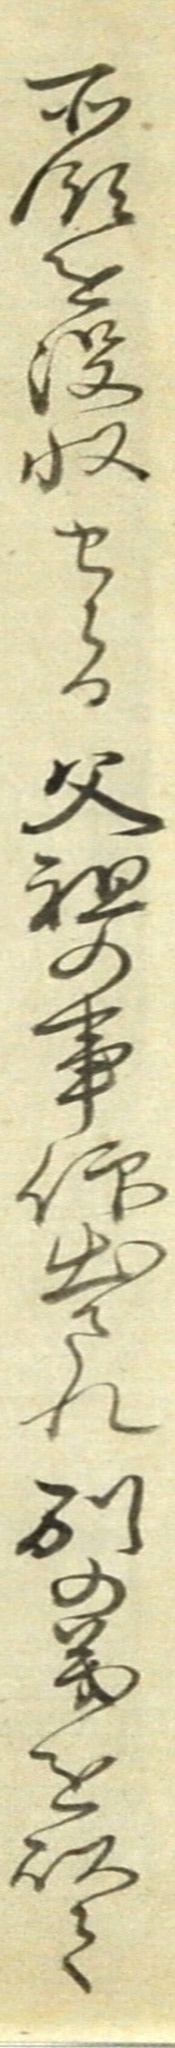所領を没収せらる父祖の事仰出され別の義を以て
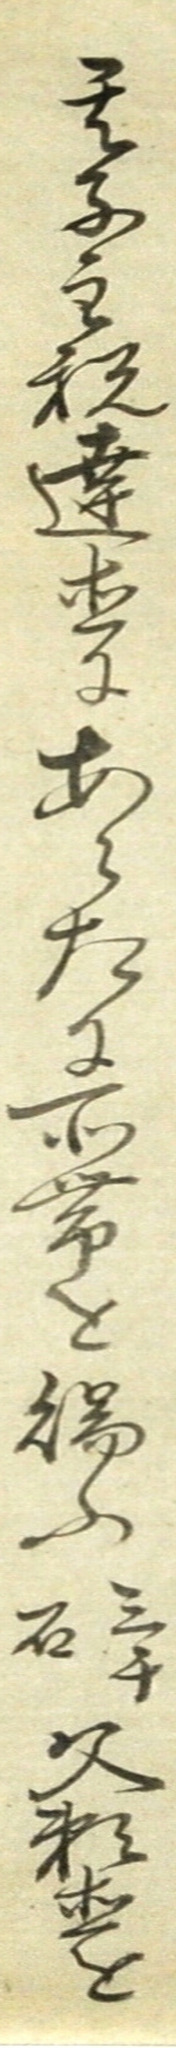其子主悦達直にあらたに所帯を賜ふ三千石父頼直を
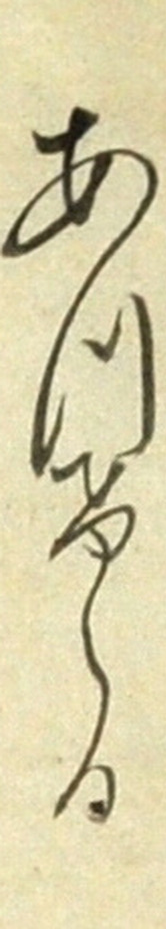あつけらる
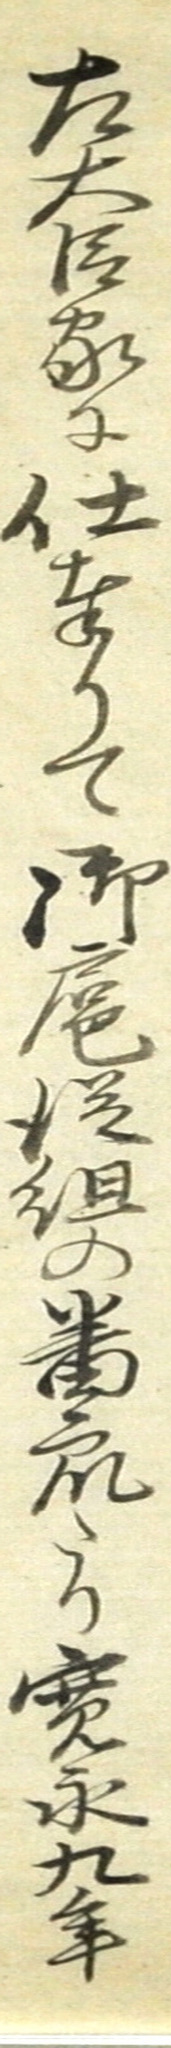左大臣家に仕奉りて御扈従組の番衆たり寛永九年
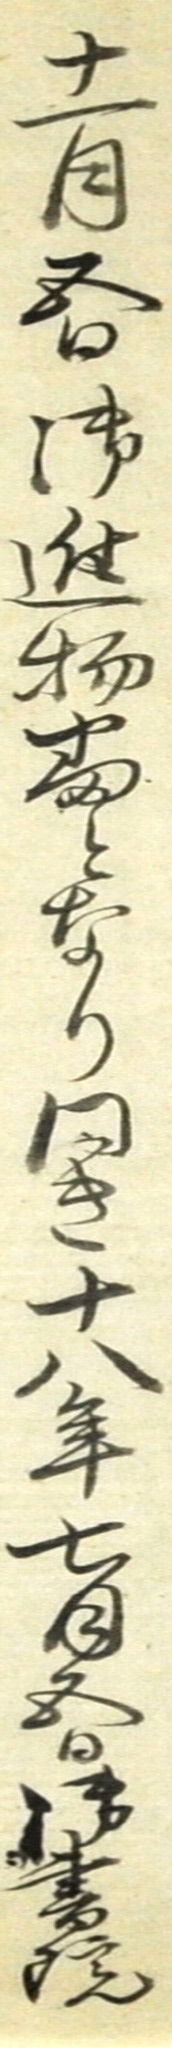十一月五日御進物番となり同き十八年七月五日御書院
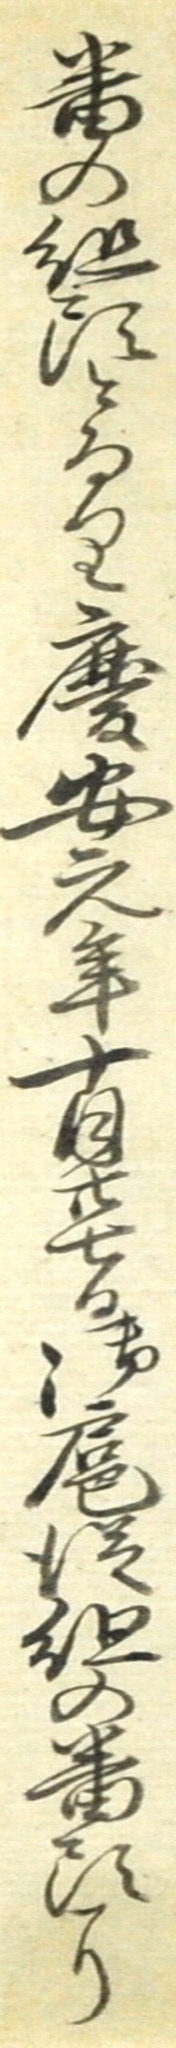番の組頭となり慶安元年十月廿七日御扈従組の番頭に
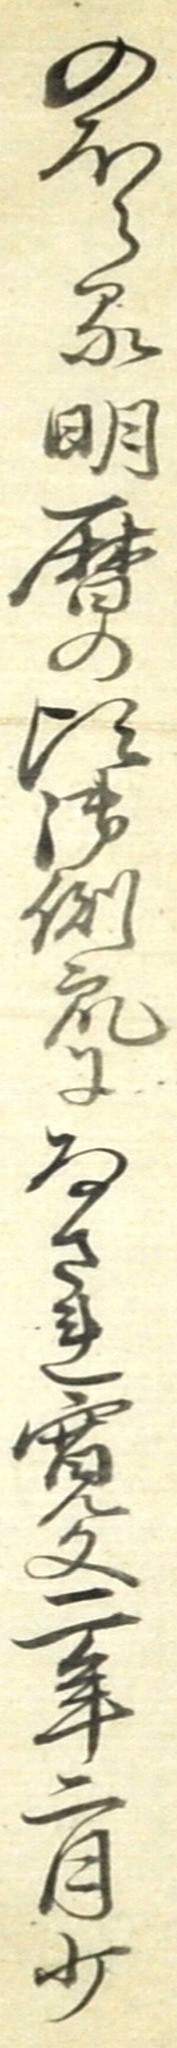のほらる明暦の頃御側衆になされ寛文二年二月少
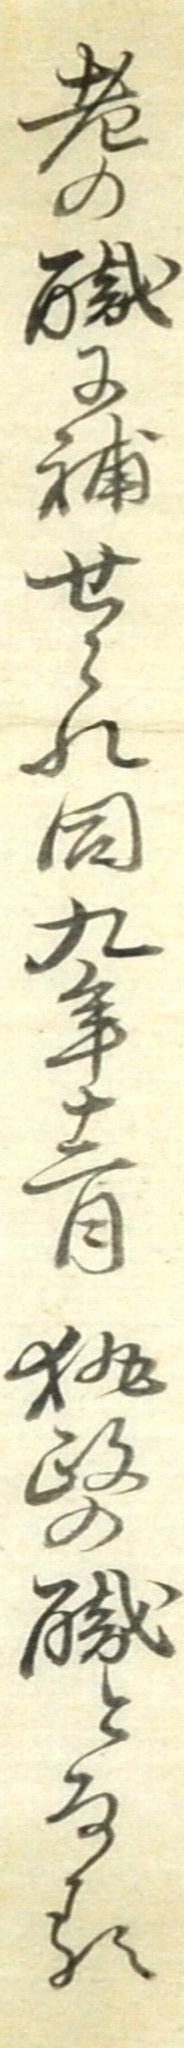老の職に補せられ同九年十二月執政の職となる
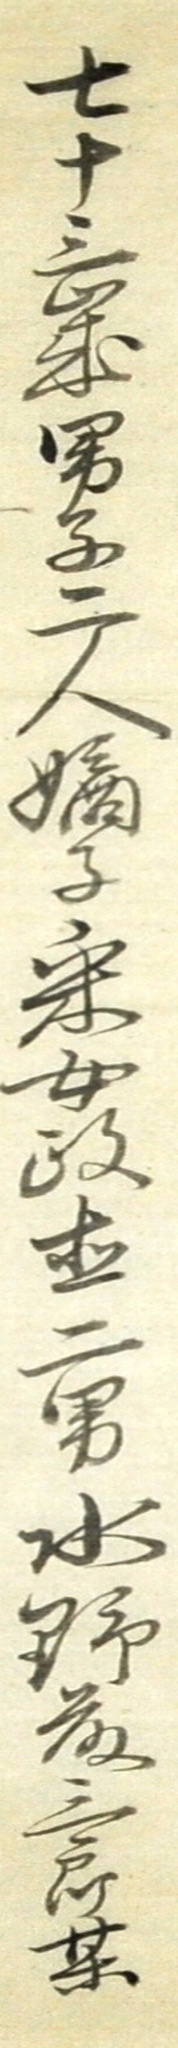七十三歳男子二人嫡子采女政直二男水野藤三郎某
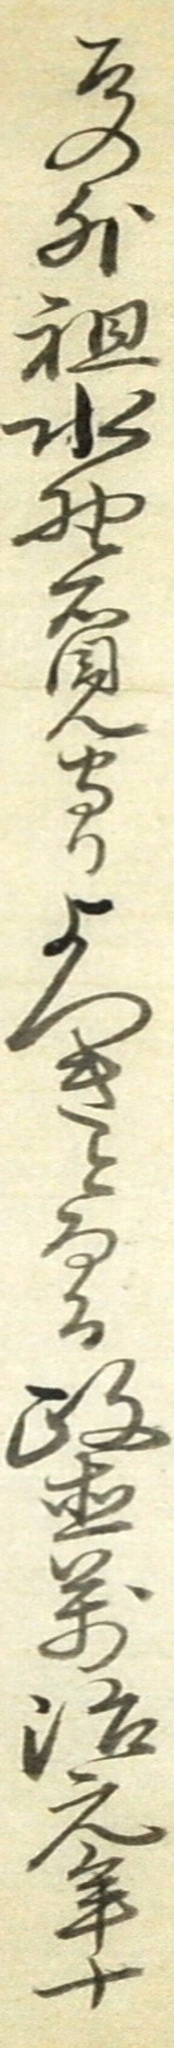その外祖水野石見守かよつきとなる政直万治元年十
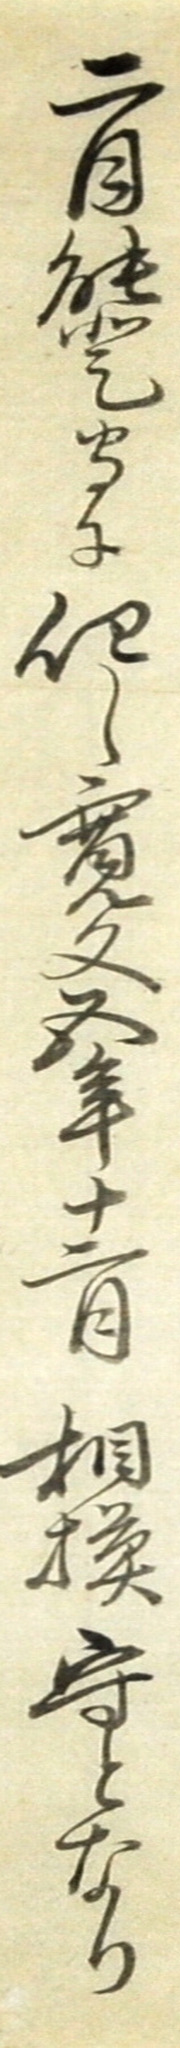二月能登守に任し寛文五年十二月相模守となり
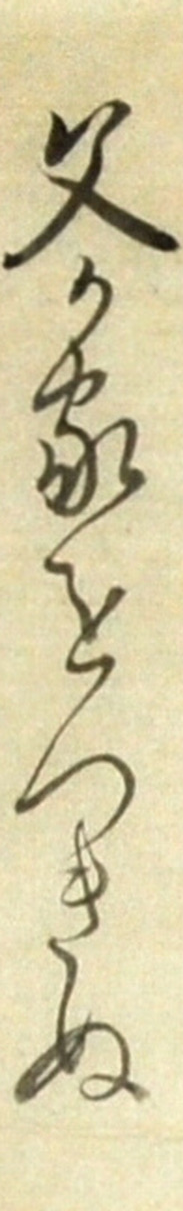父か家をつきぬ

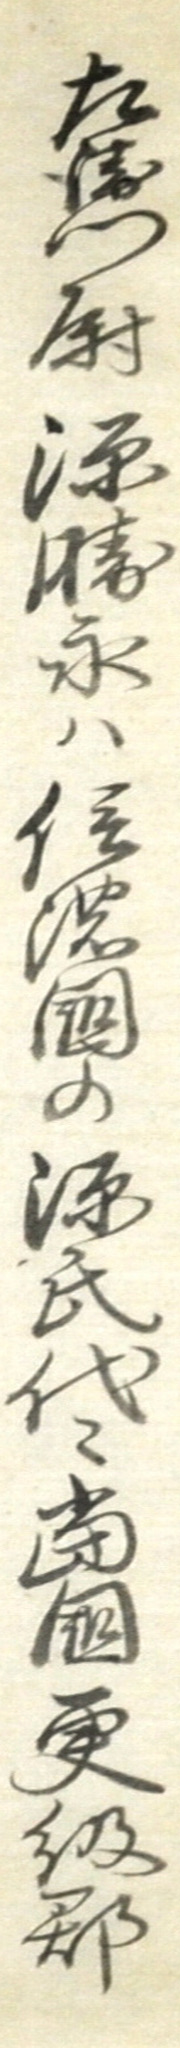左衛門尉源勝永は信濃国の源氏代々当国更級郡
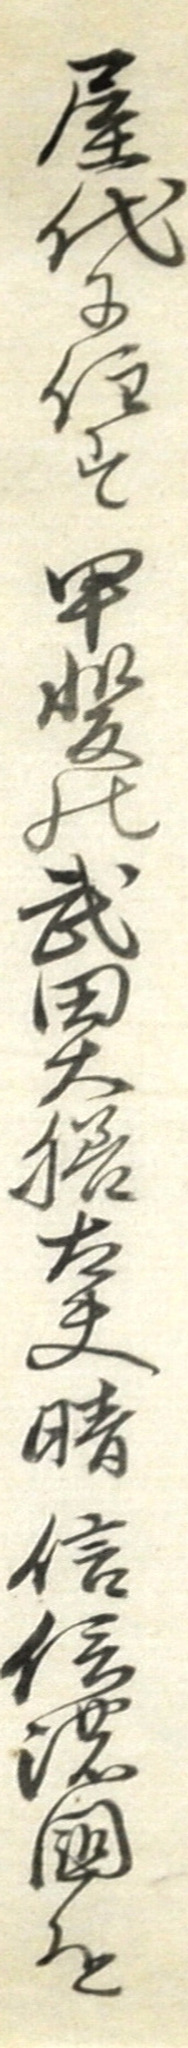屋代に住す甲斐の武田大膳太夫晴信信濃国を
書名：藩翰譜（六）
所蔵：伊那市立高遠町図書館・合同会社AMANE
